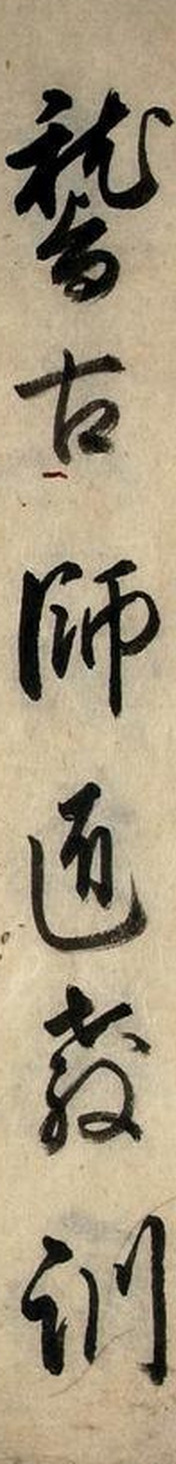稽古師匠教訓
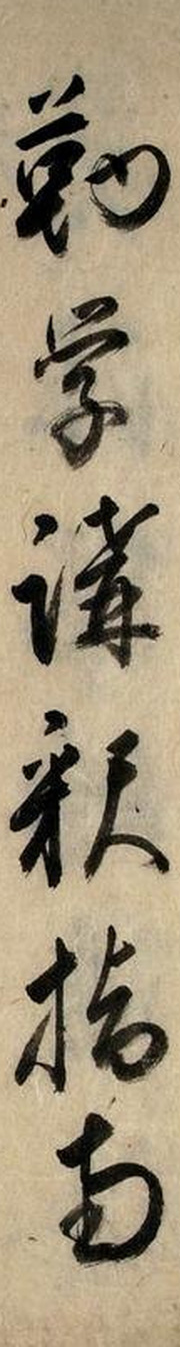勤学講釈指南
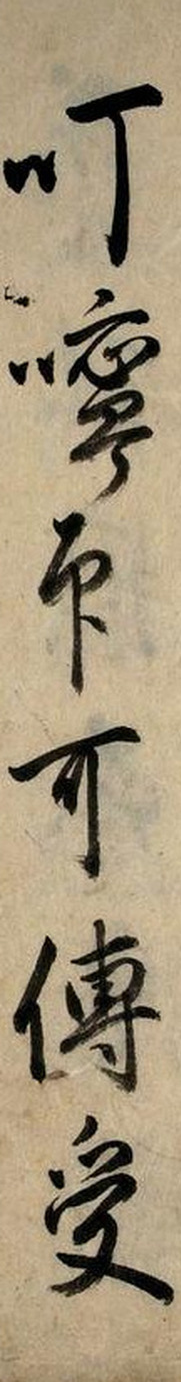叮嚀印可伝受
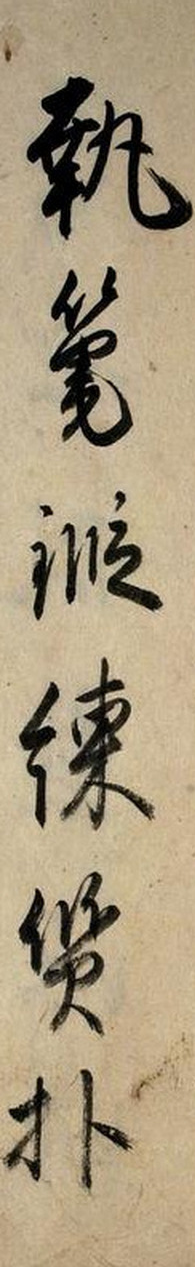執筆鍛練質朴
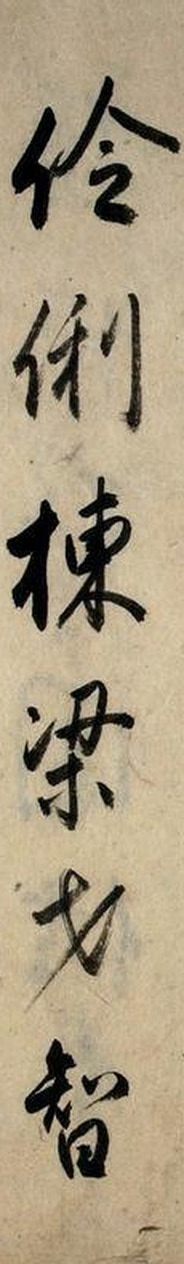伶俐棟梁才智
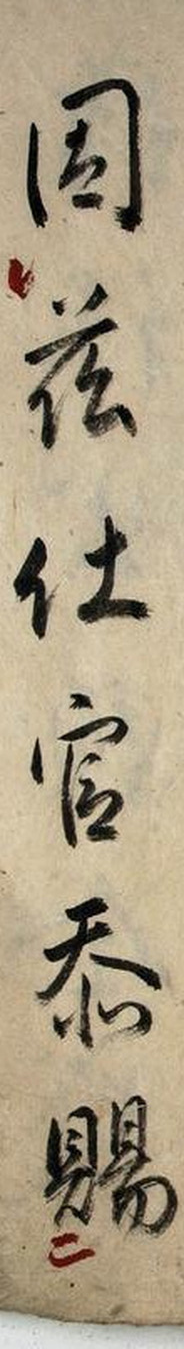因茲仕官忝賜

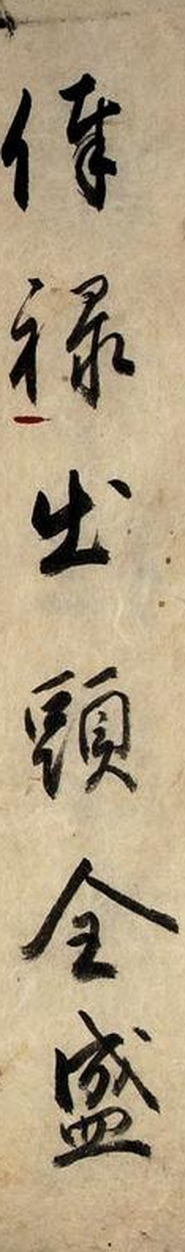俸禄出頭全盛
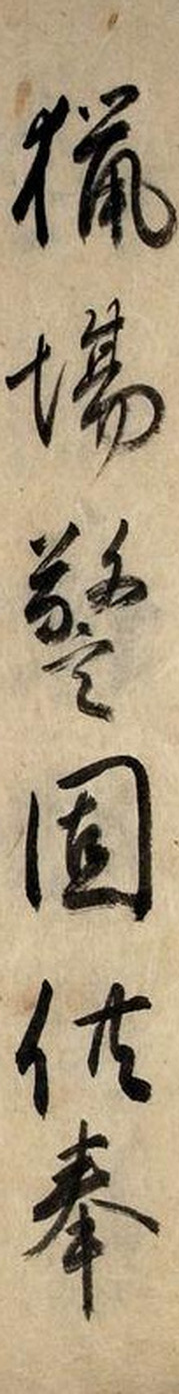猟場警固供奉
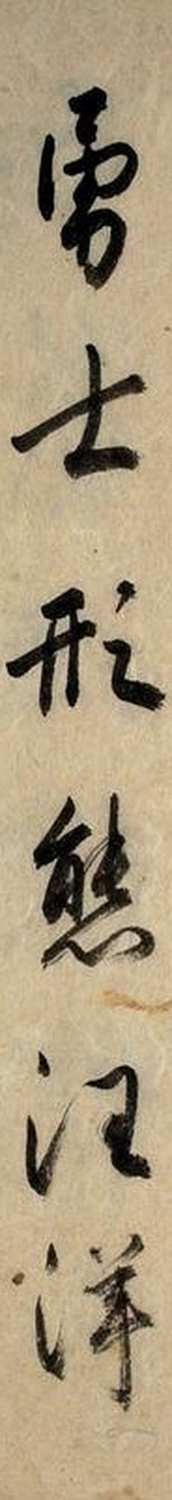勇士形態汪洋
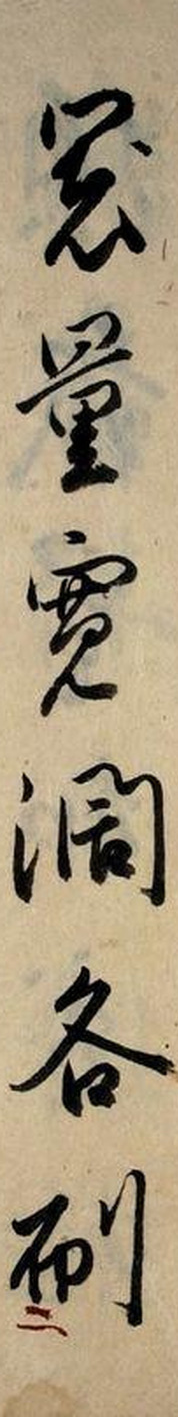器量寛闊各刷
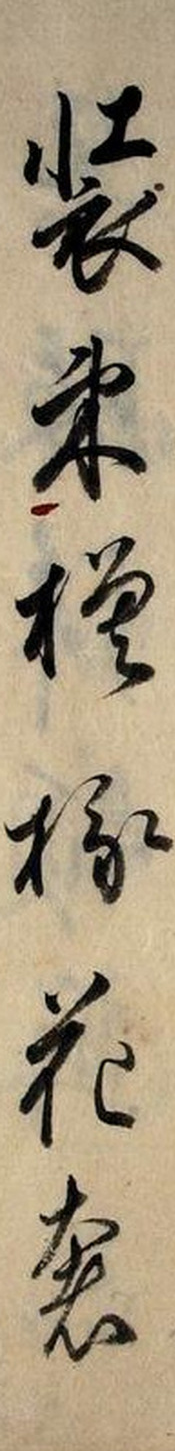装束模様花奢

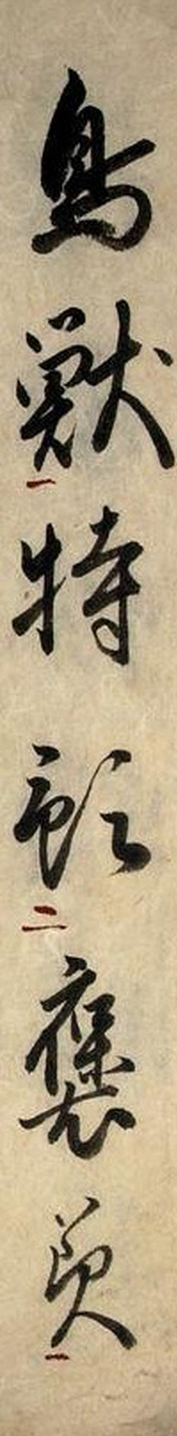鳥獣特預褒美
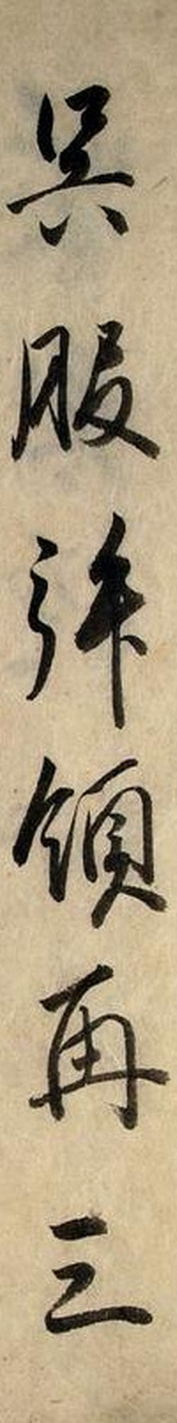呉服拝領再三
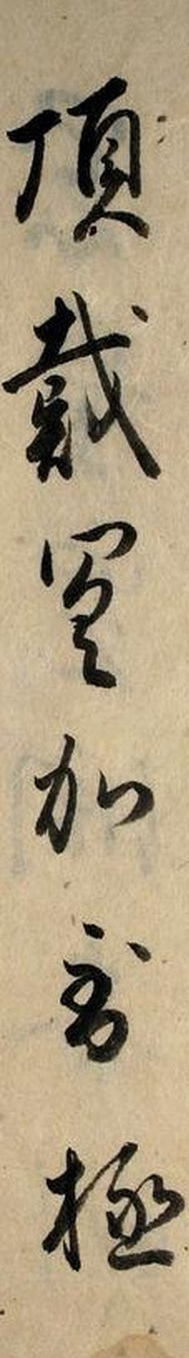頂戴冥加至極
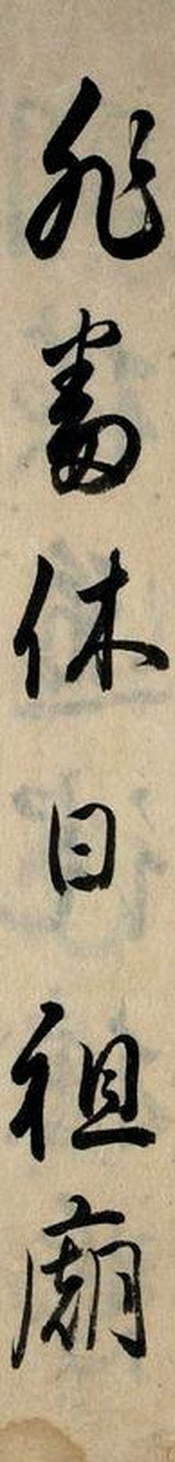非番休日祖廟
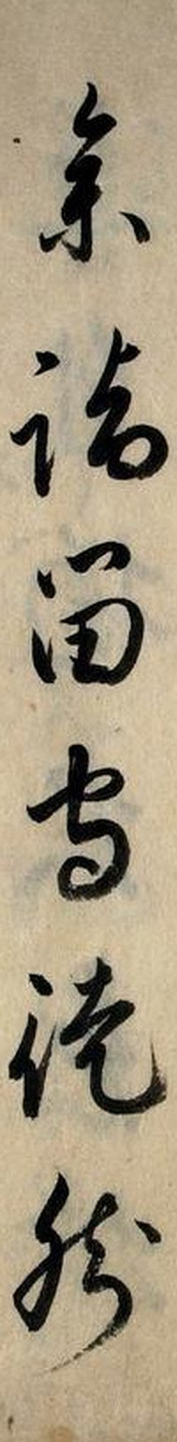参詣留守徒然
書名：世話千字文（手習手本）
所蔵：福井県文書館 Fukui Prefectural Archives
